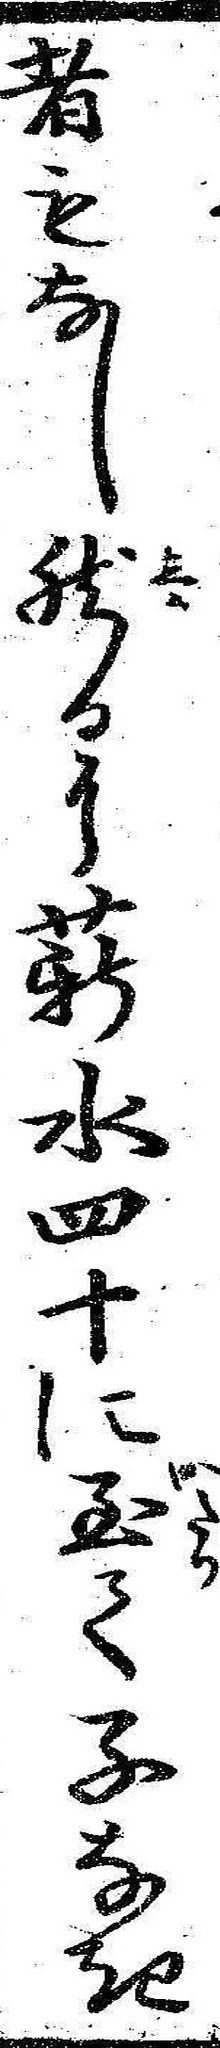者もなし然るに薪水四十に至て子なき
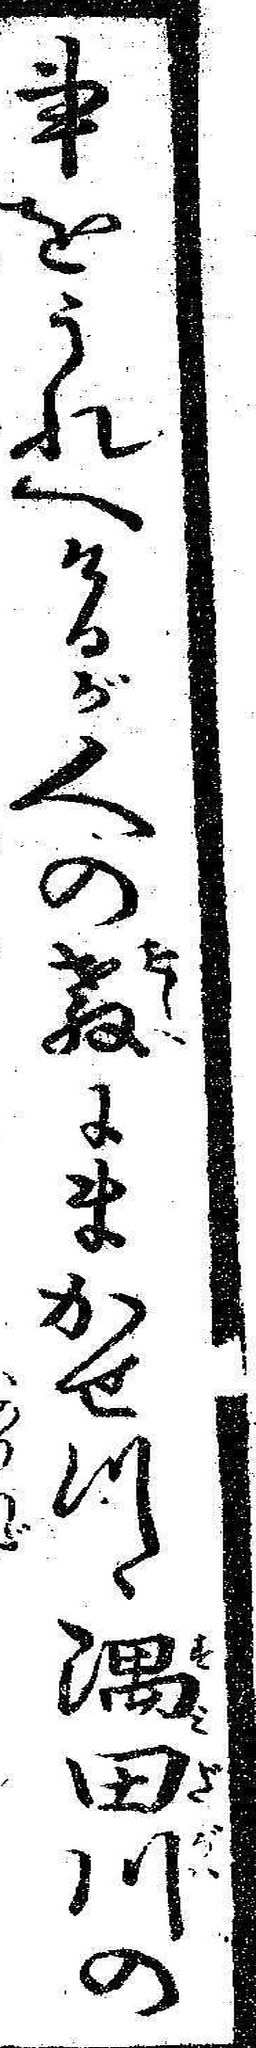事をうれへけるが人の教にまかせつゝ隅田川の
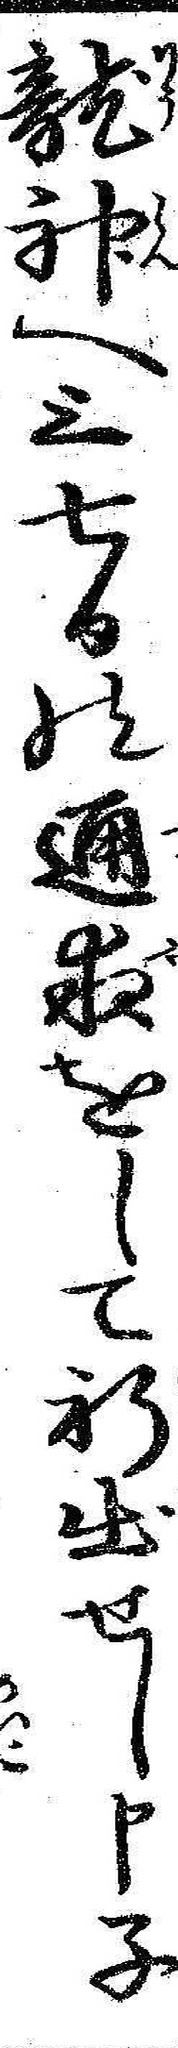竜神へ三七日の通夜をして祈出せし申子
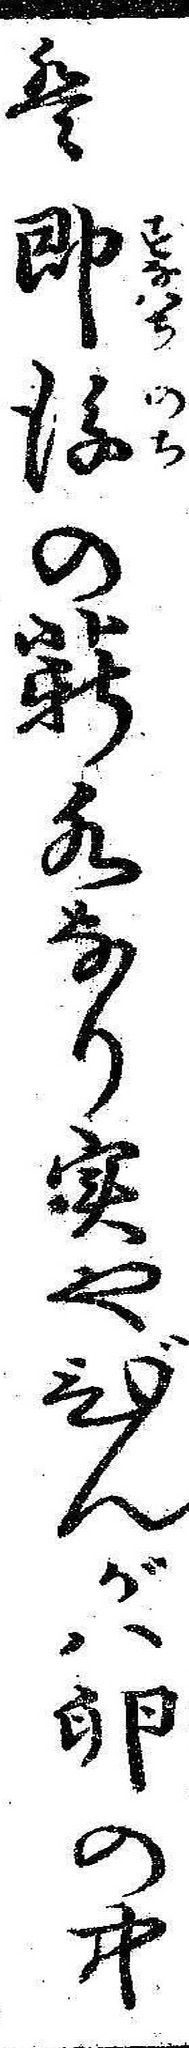は即後の薪水なり実やびんがは卵の中
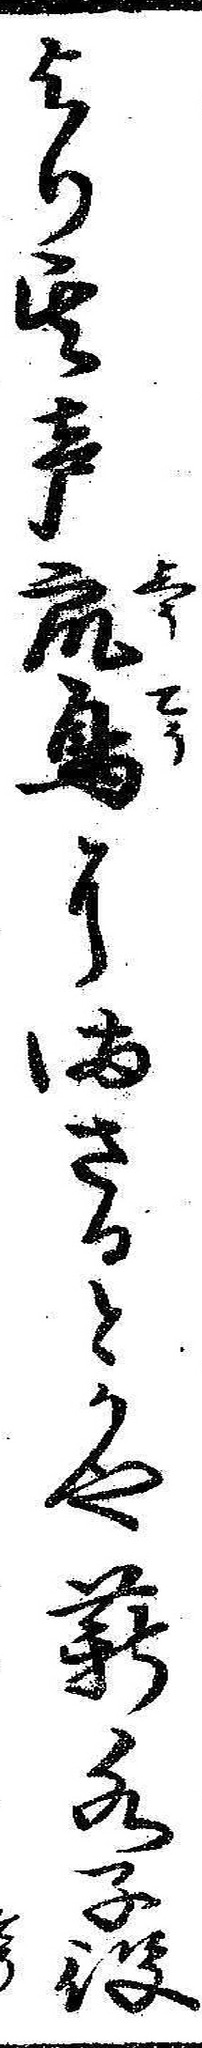より其声衆鳥にまさるとかや薪水子役
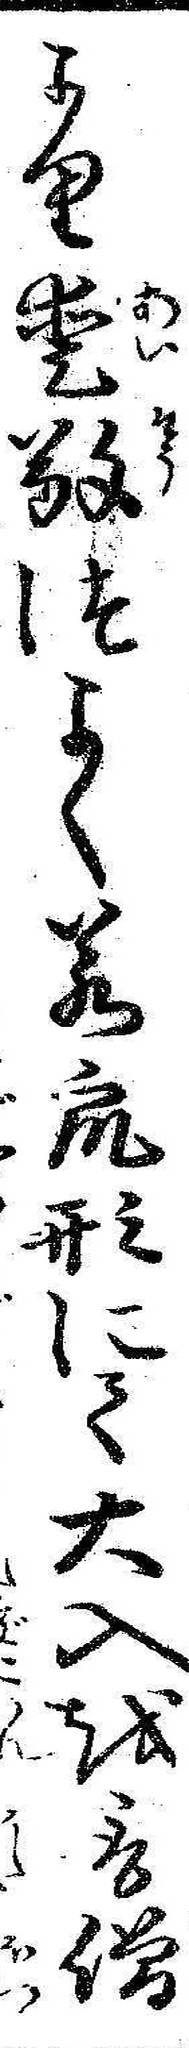より愛敬つよく若衆形にて大入を取僧
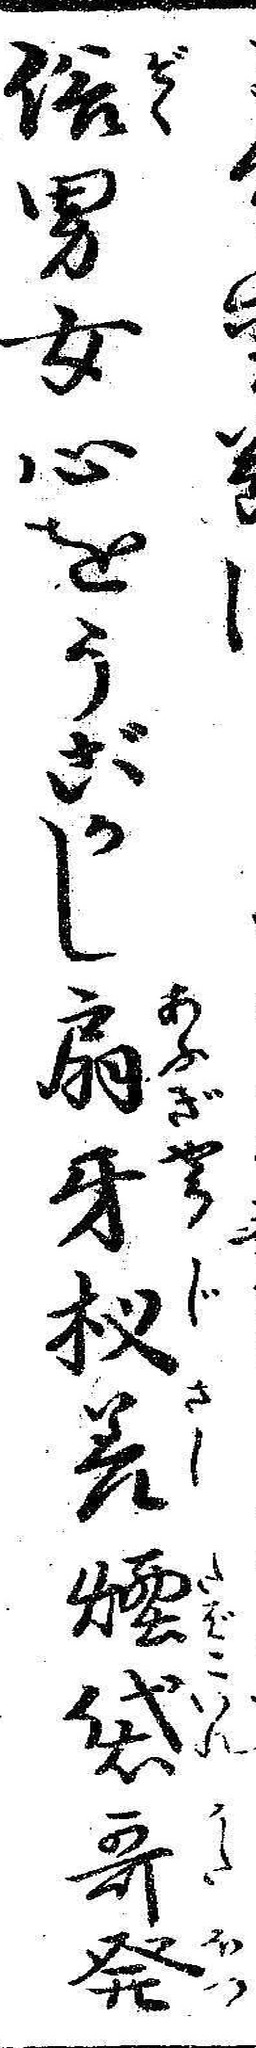俗男女心をうごかし扇牙杈差煙袋哥発
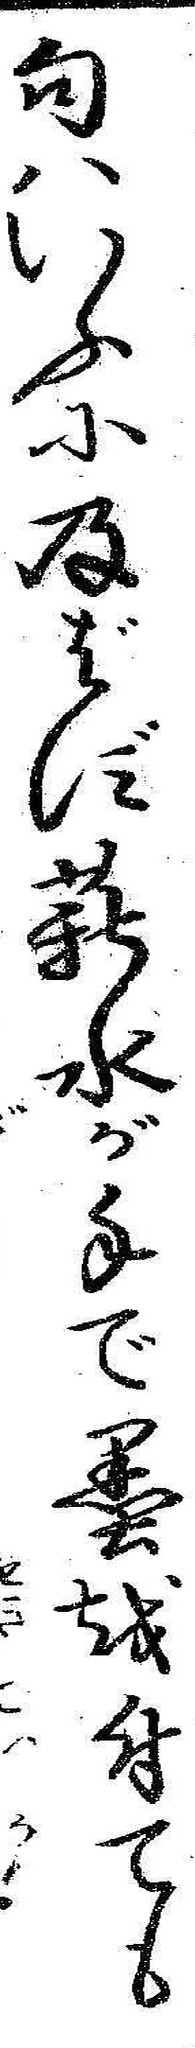句はいふに及ばず薪水が手で墨を付ても
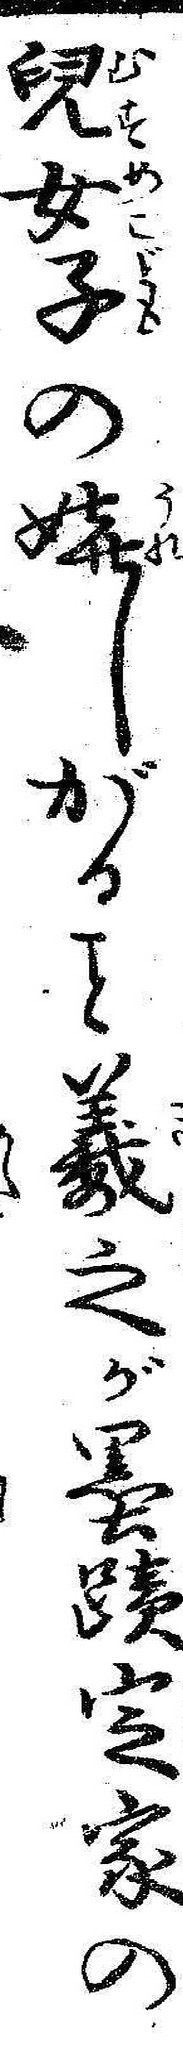兒女子の嬉しがること義之が墨蹟定家の
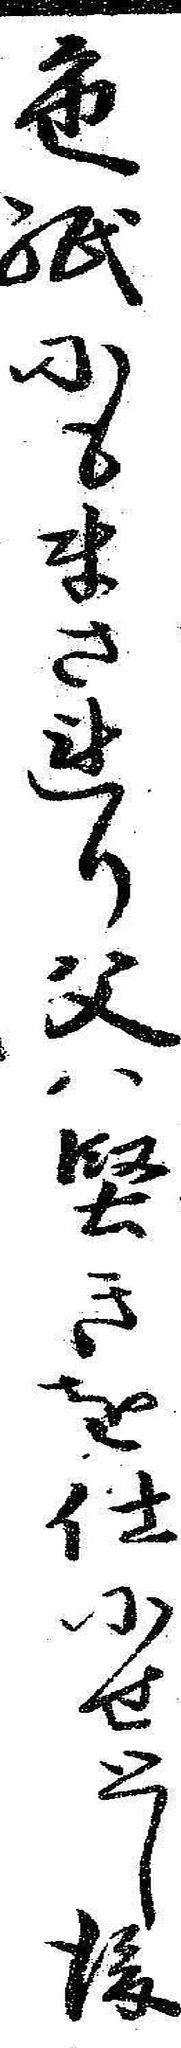色紙にもまされり父は堅きを仕にせとし後
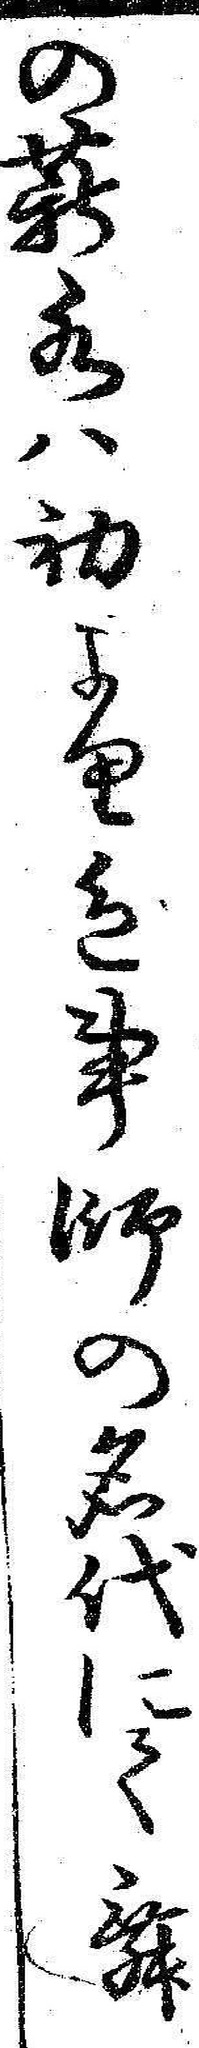の薪水は初より色事師の名代にて舞

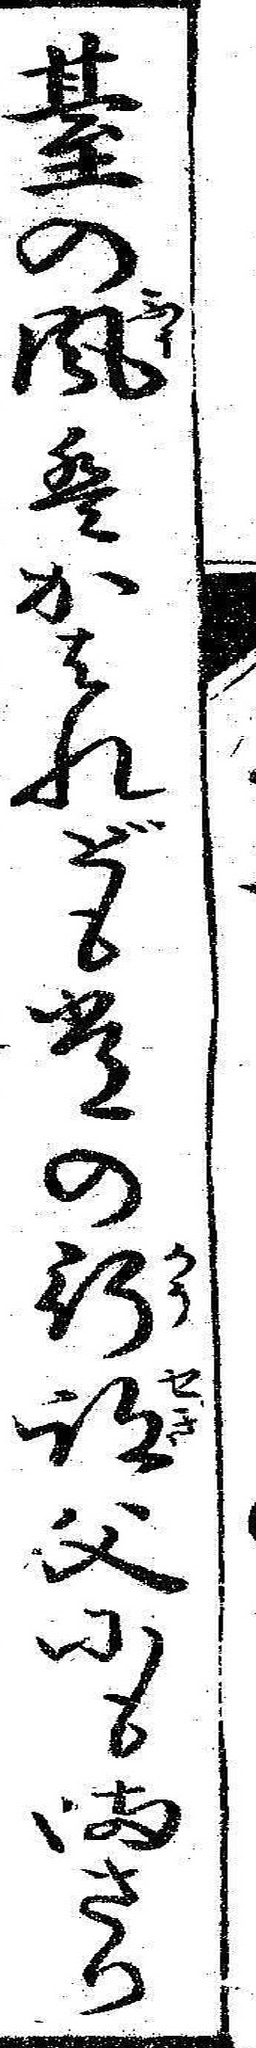台の風はかはれども常の行跡父にもまさり
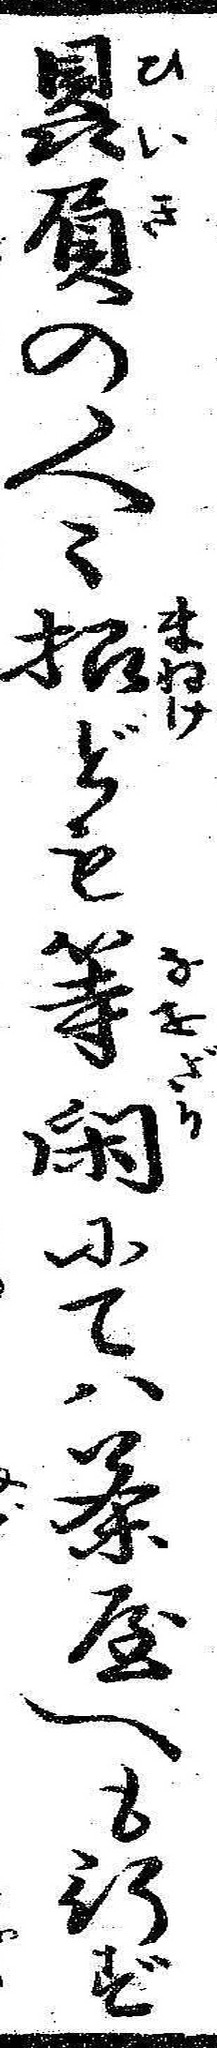贔屓の人々招ども等閑にては茶屋へも行ず
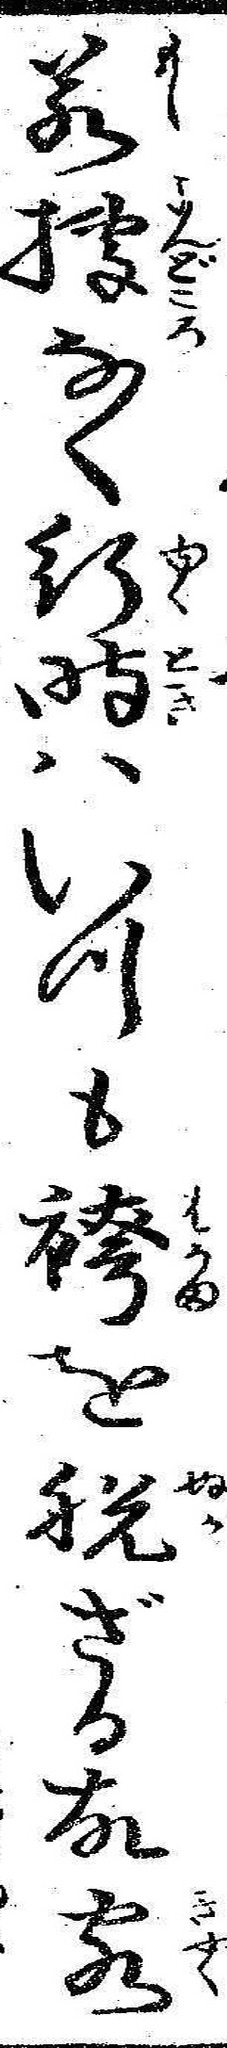若拠なく行時はいつも袴を脱ざる故客
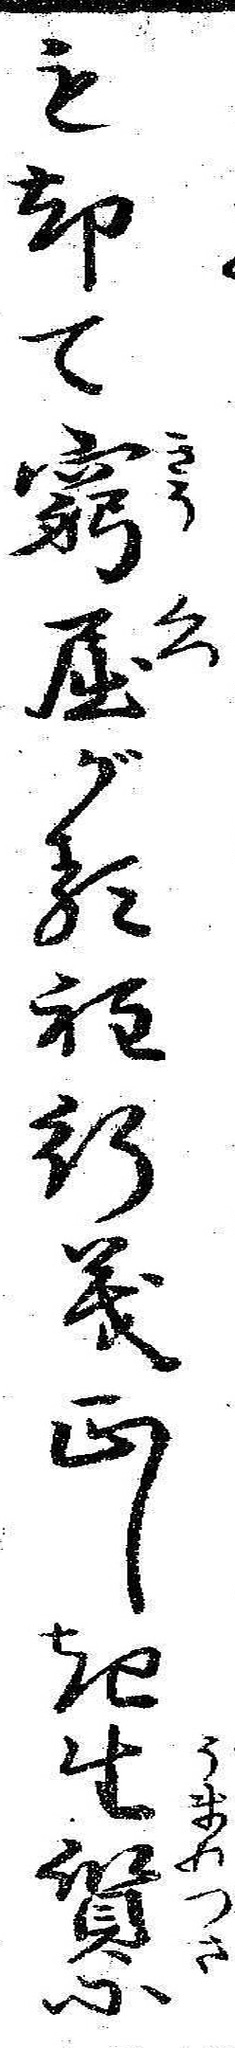も却て窮屈がる程行義正しき生質に
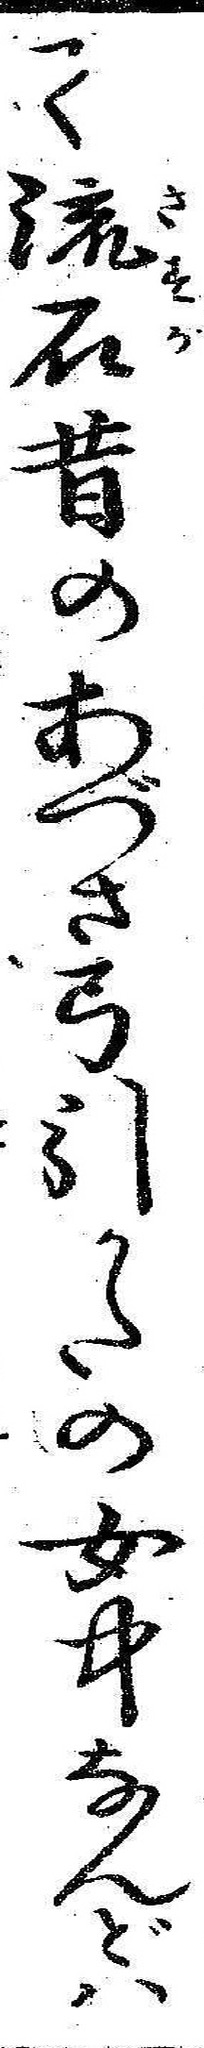て流石昔のあづさ弓引かたの女中なんどは
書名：根無草後編
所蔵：国文学研究資料館
